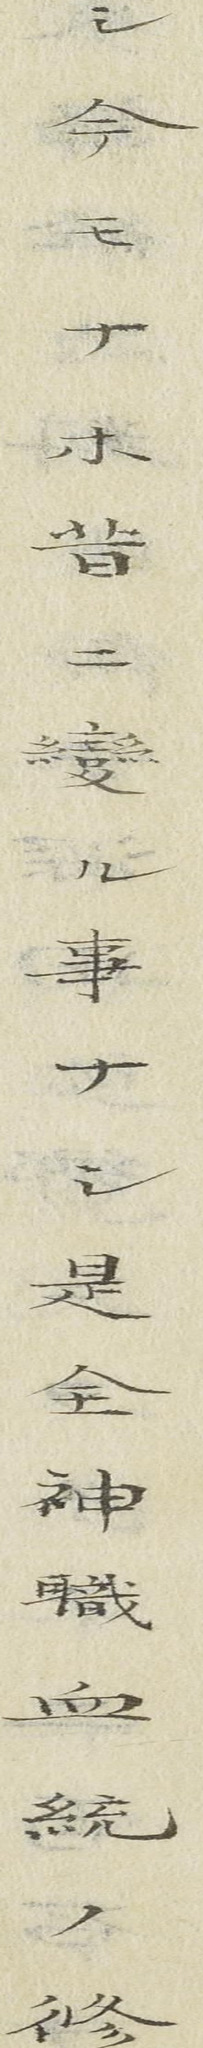シ今モナホ昔ニ変ル事ナシ是全神職血統ノ修
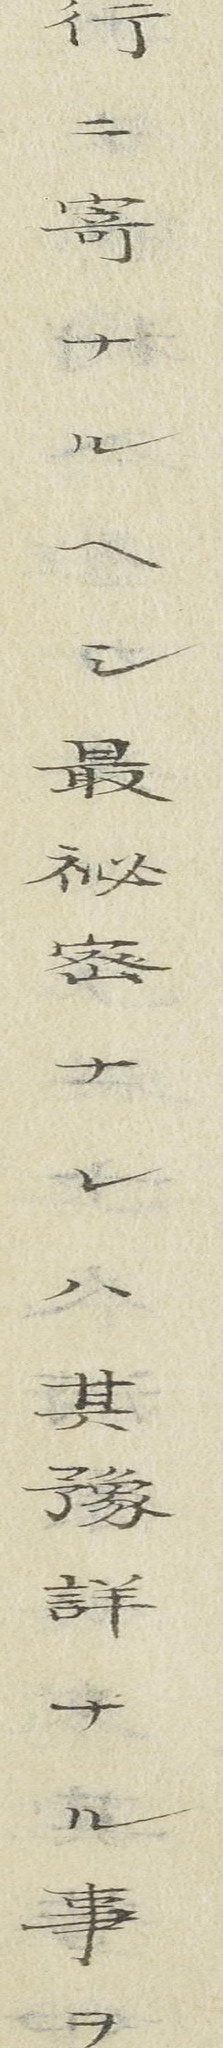行ニ寄ナルヘシ最秘密ナレハ其予詳ナル事ヲ
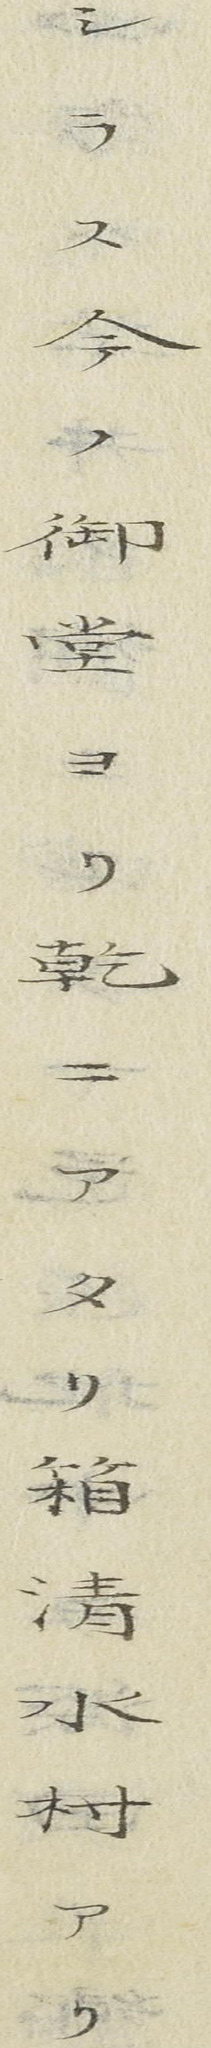シラス今ノ御堂ヨリ乾ニアタリ箱清水村アリ

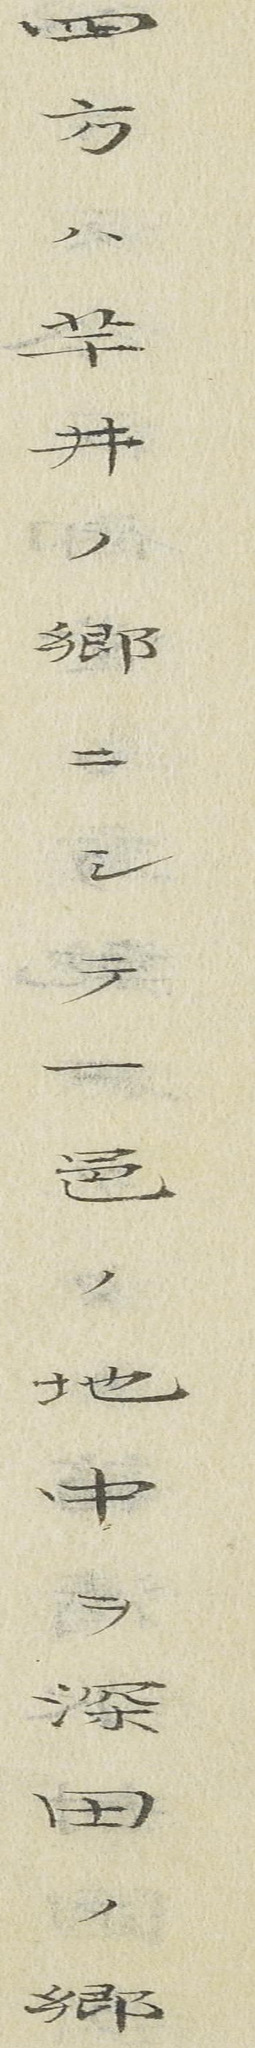四方ハ芋井ノ郷ニシテ一邑ノ地中ヲ深田ノ郷
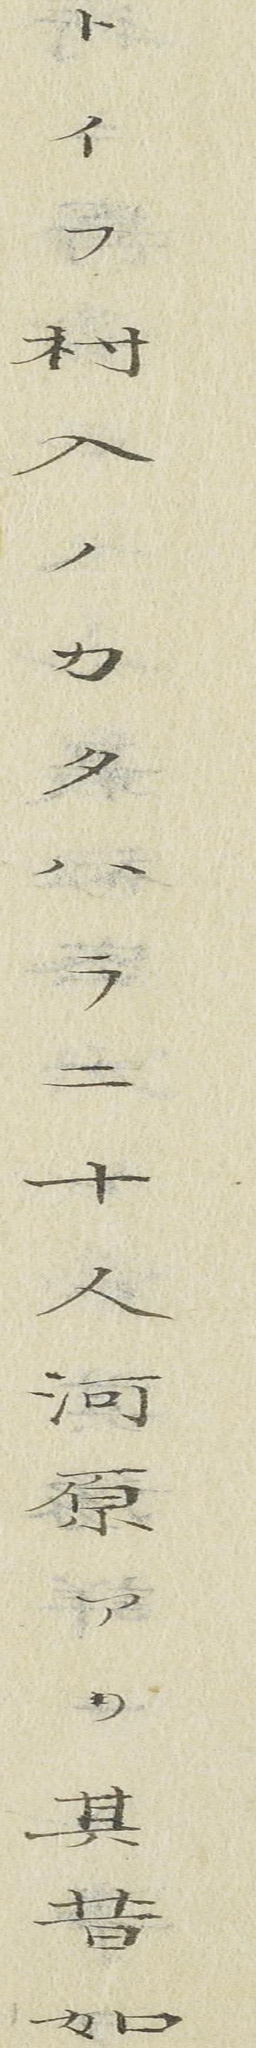トイフ村入ノカタハラニ十人河原アリ其昔如
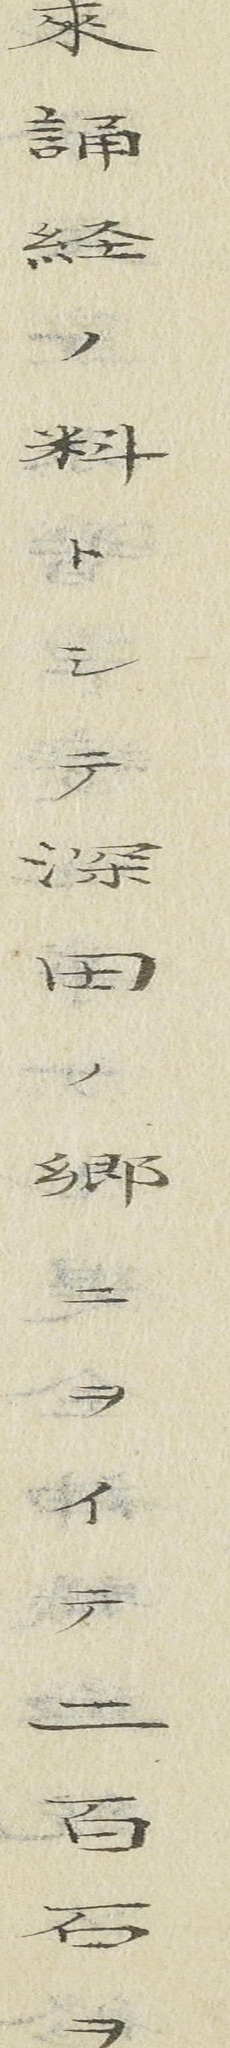来誦経ノ料トシテ深田ノ郷ニヲイテ二百石ヲ
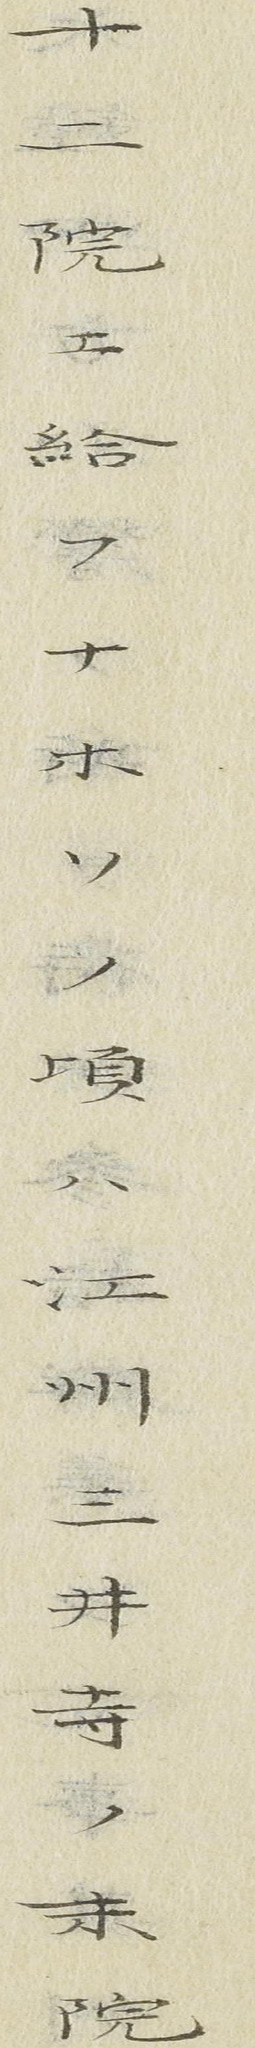十二院エ給フナホソノ頃ハ江州三井寺ノ末院
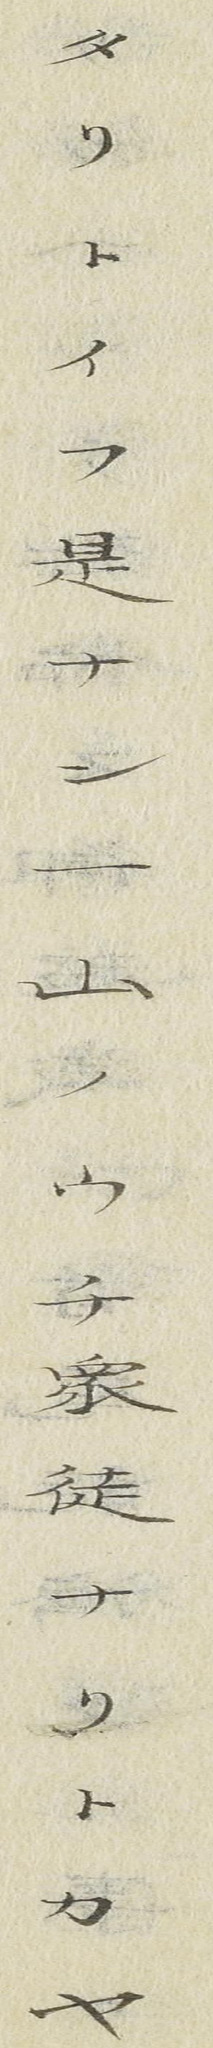タリトイフ是ナン一山ノウチ衆徒ナリトカヤ
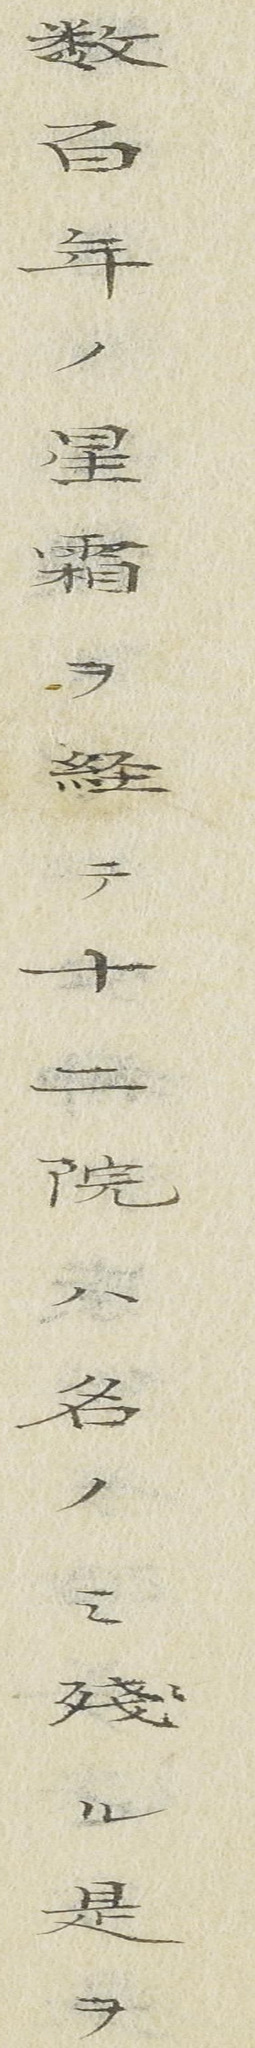数百年ノ星霜ヲ経テ十二院ハ名ノミ残ル是ヲ
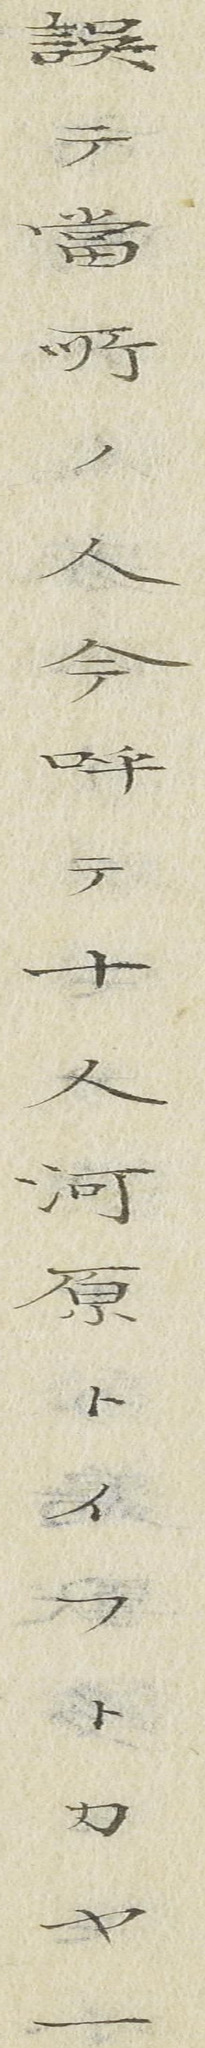誤テ当所ノ人今呼テ十人河原トイフトカヤ一
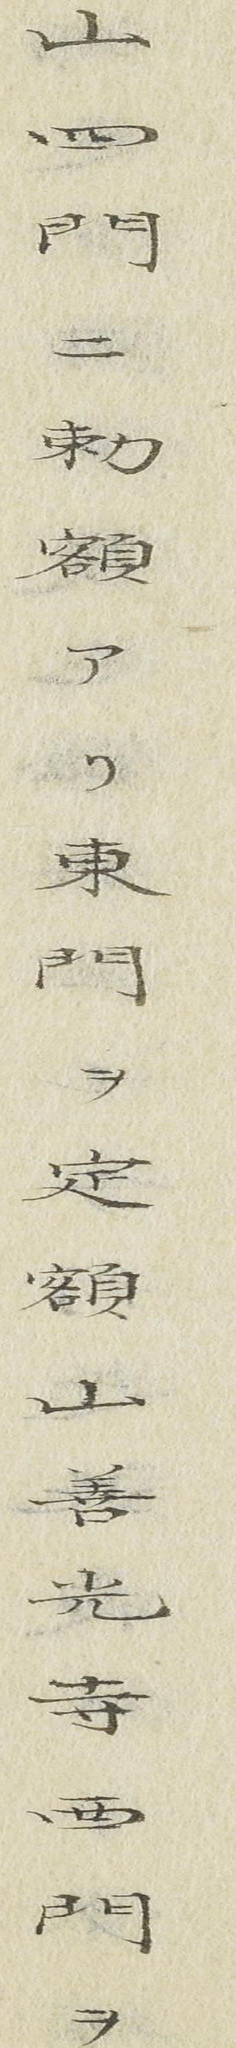山四門ニ勅額アリ東門ヲ定額山善光寺西門ヲ
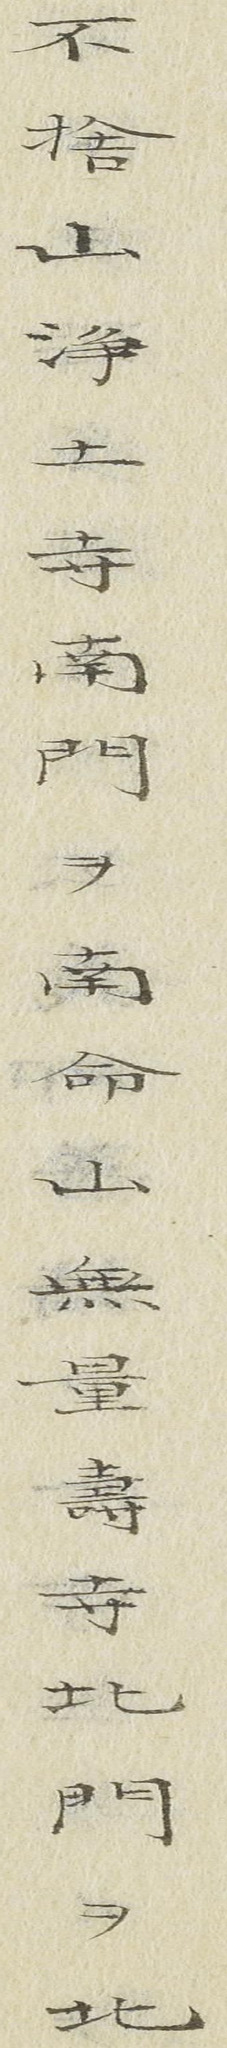不捨山浄土寺南門ヲ南命山無量寿寺北門ヲ北
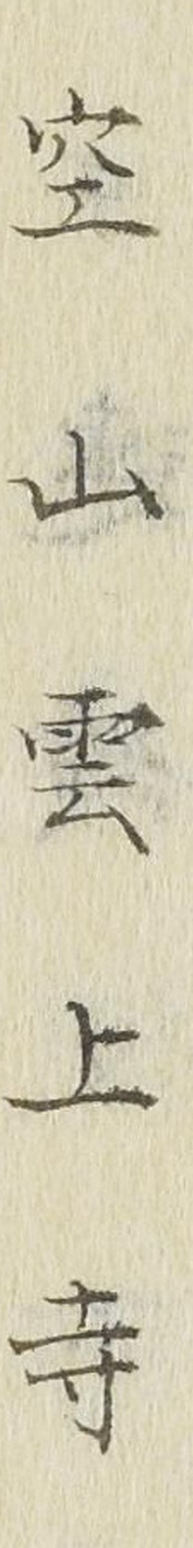空山曇上寺
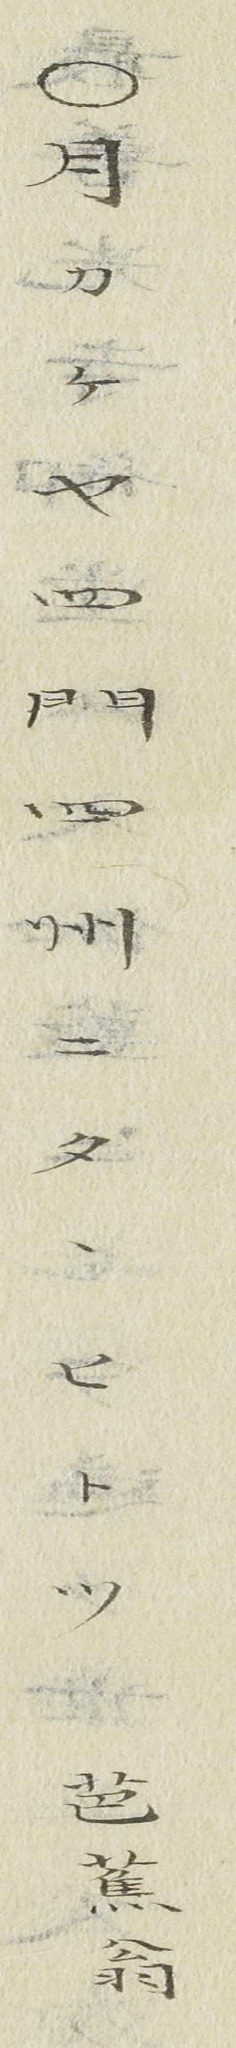〇月カケヤ四門四州ニタヽヒトツ芭蕉翁
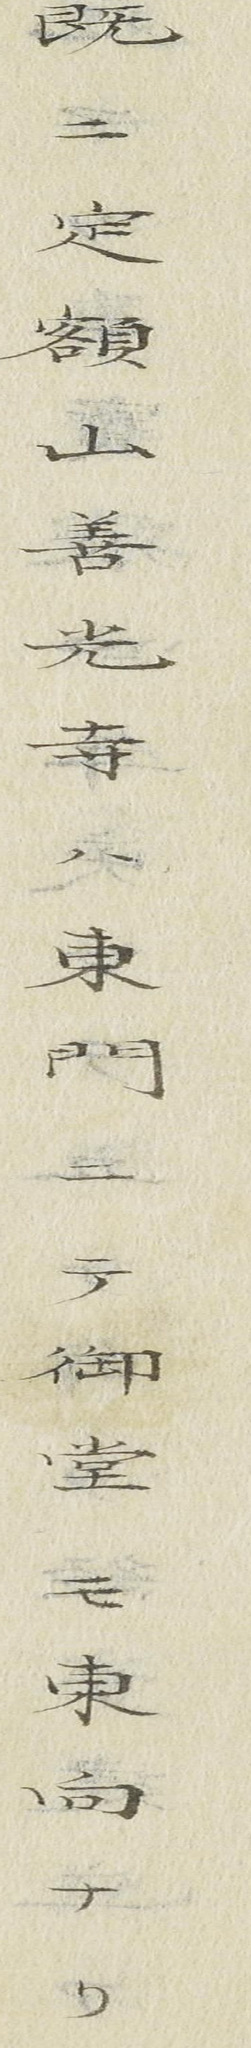既ニ定額山善光寺ハ東門ニテ御堂モ東向ナリ
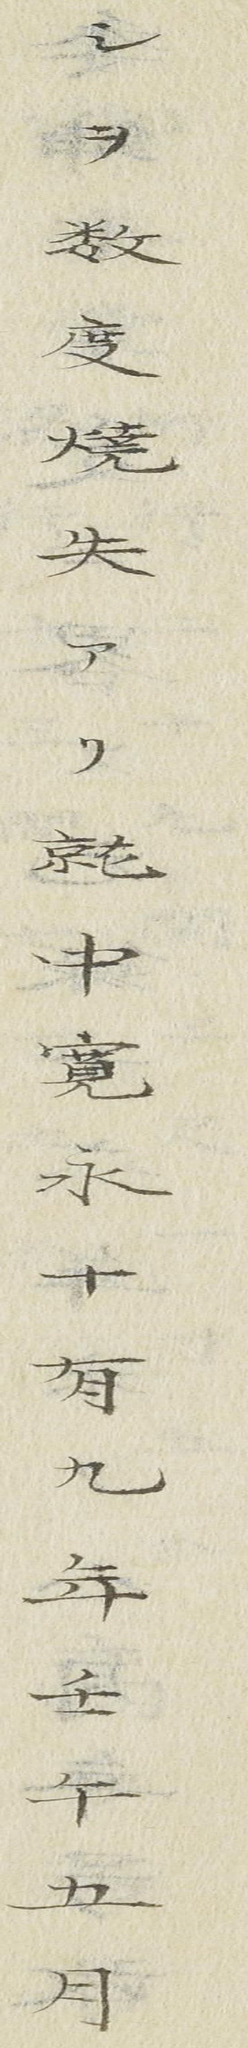シヲ数度焼失アリ就中寛永十有九年壬午五月
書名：地災撮要　地震之部　巻ノ二
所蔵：東京大学地震研究所図書室 Earthquake Research Institute Library, The University of Tokyo, JAPAN
